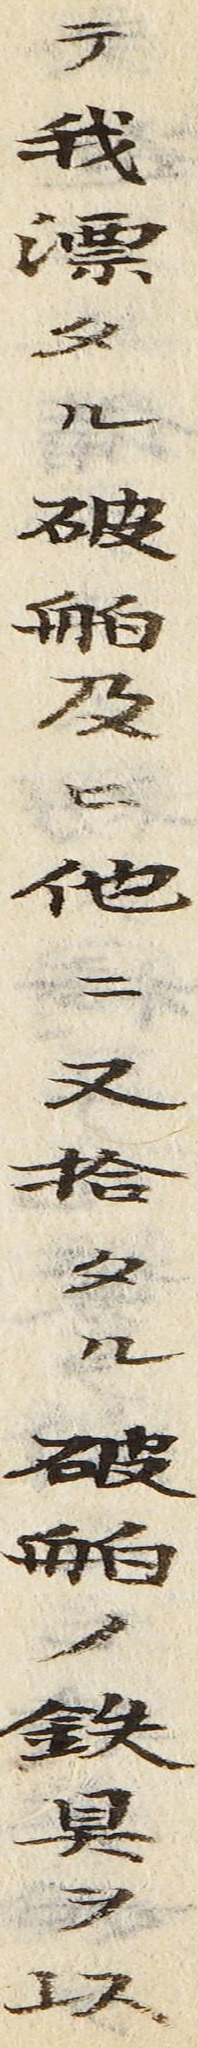テ我漂タル破舶及ヒ他ニ又拾タル破舶ノ鉄具ヲ以
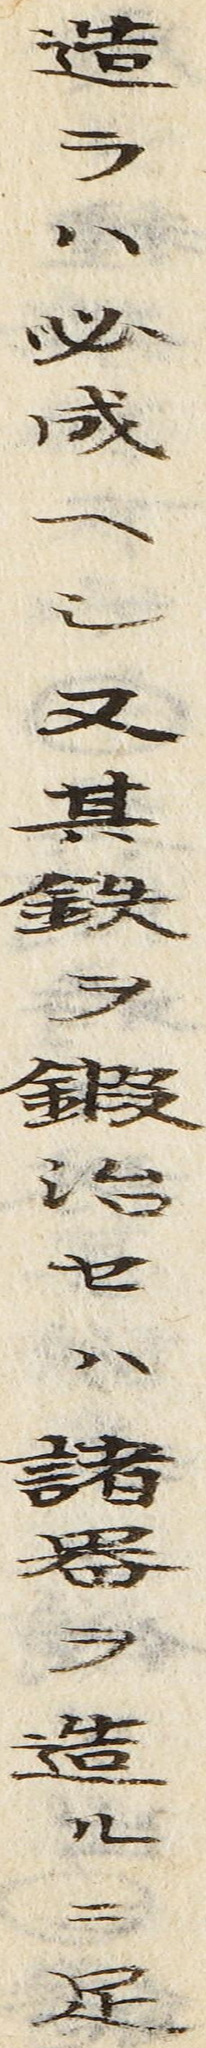造ラハ必成ヘシ又其鉄ヲ鍜治セハ諸器ヲ造ルニ足
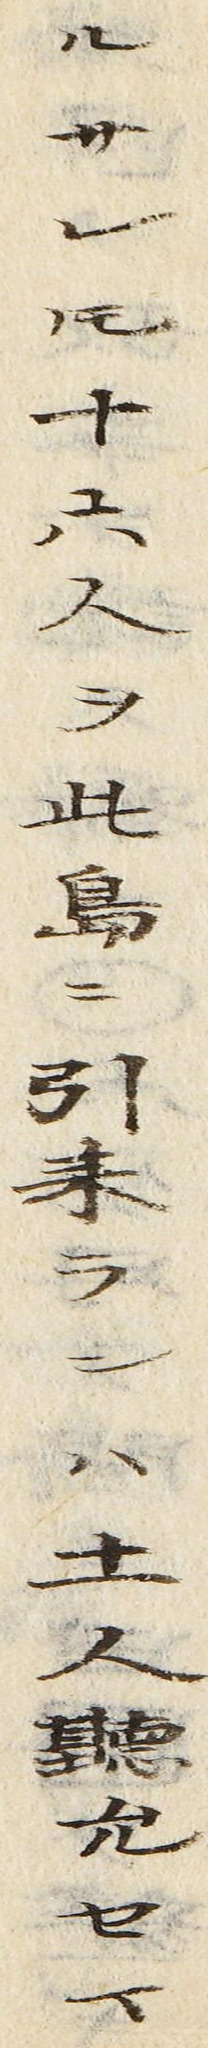ルサレトモ十六人ヲ此島ニ引来ランハ土人聴允セマ
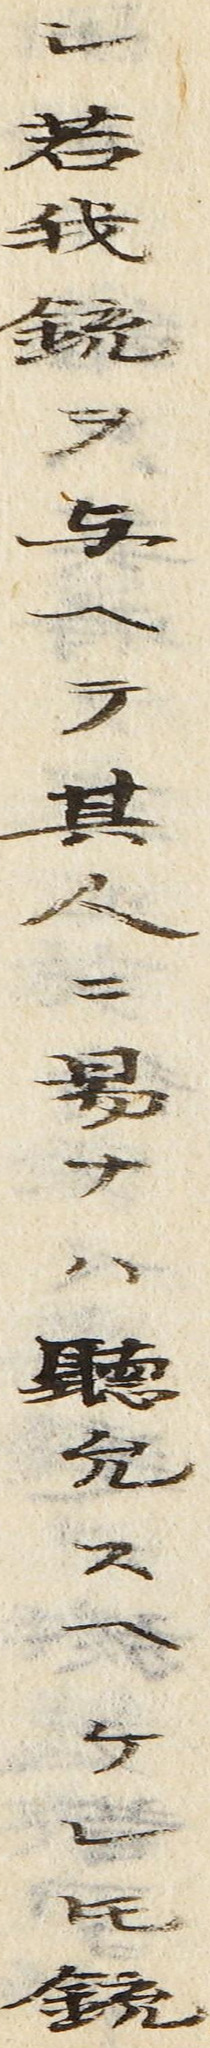シ若我銃ヲ与ヘテ其人ニ易ナハ聴允スヘケレトモ銃
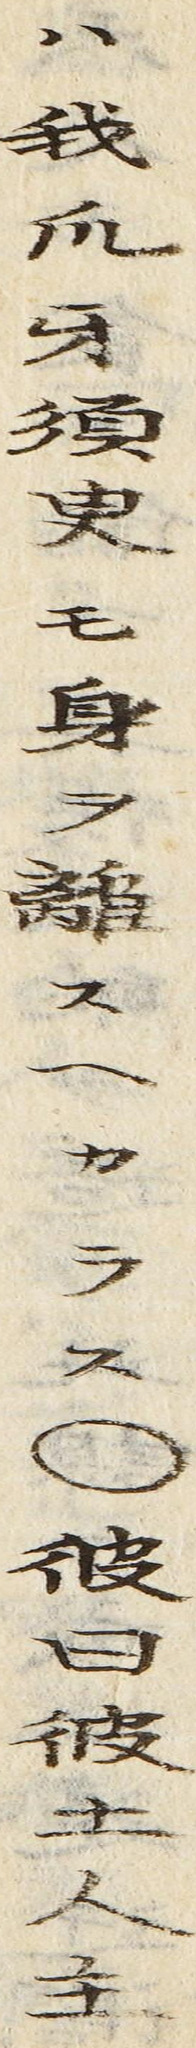ハ我爪牙須臾モ身ヲ離スヘカラス◯彼曰彼土人主
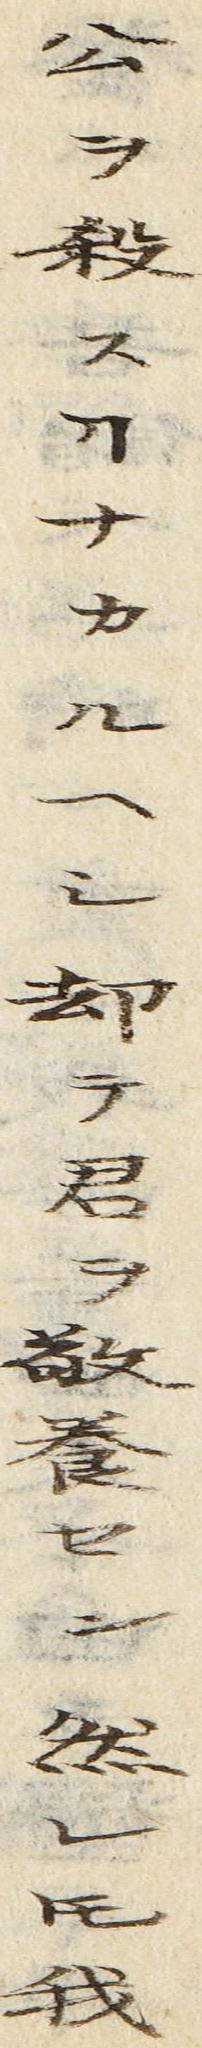公ヲ殺スコトナカルヘシ却テ君ヲ敬養セン然レトモ我
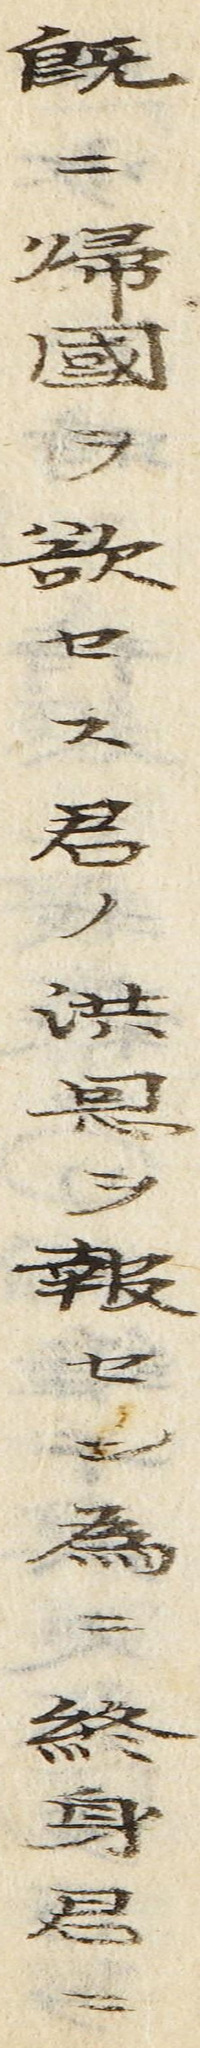既ニ帰国ヲ欲セス君ノ洪恩ヲ報セン為ニ終身君ニ
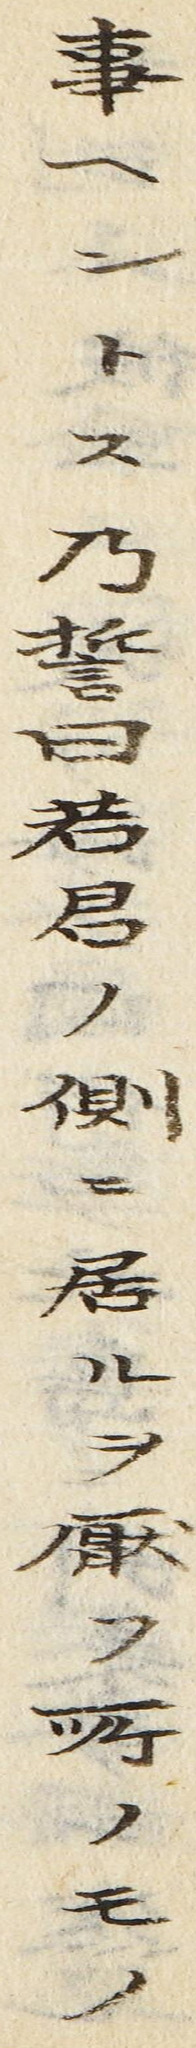事ヘントス乃誓曰若君ノ側ニ居ルヲ厭フ所ノモノ
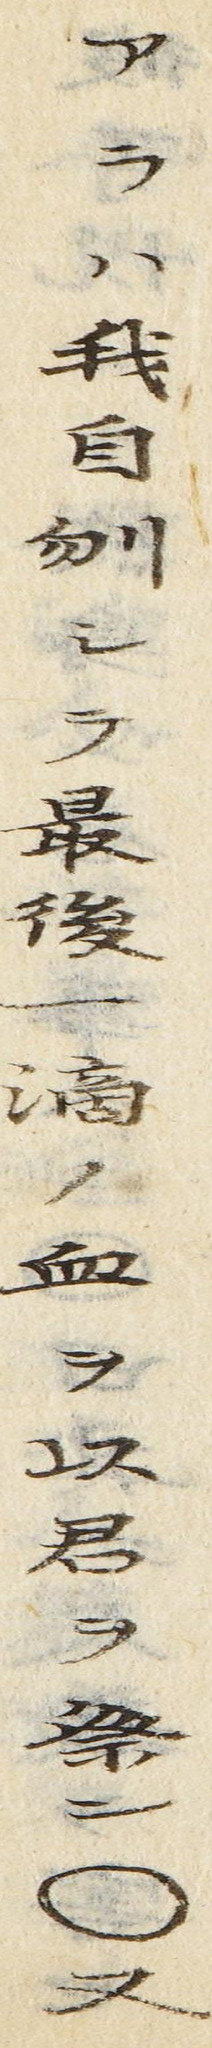アラハ我自刎シテ最後一滴ノ血ヲ以君ヲ祭ン◯又
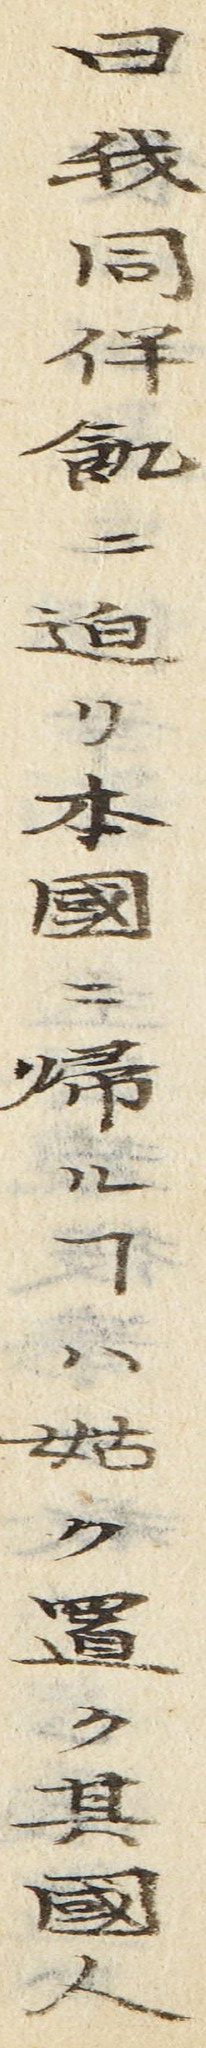曰我同伴飢ニ迫リ本国ニ帰ルコトハ姑ク置ク其国人

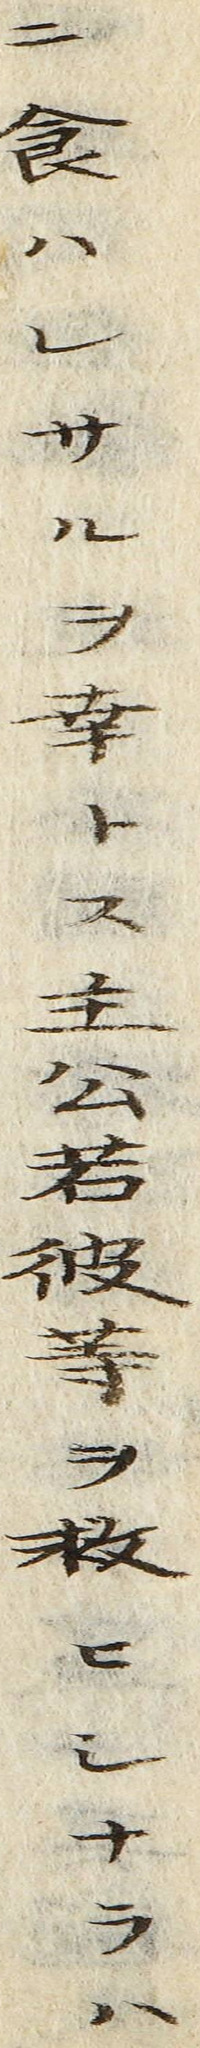ニ食ハレサルヲ幸トス主公若彼等ヲ救ヒシナラハ
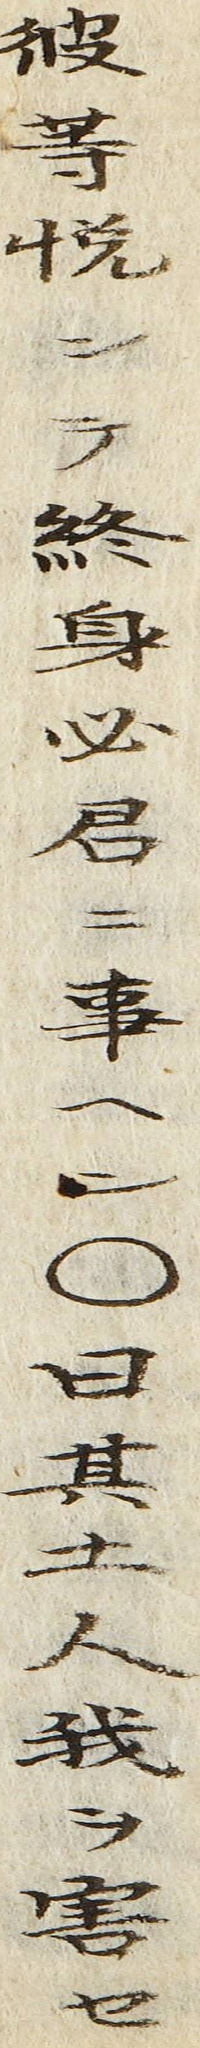彼等悦ンテ終身必君ニ事ヘン◯曰其土人我ヲ害セ
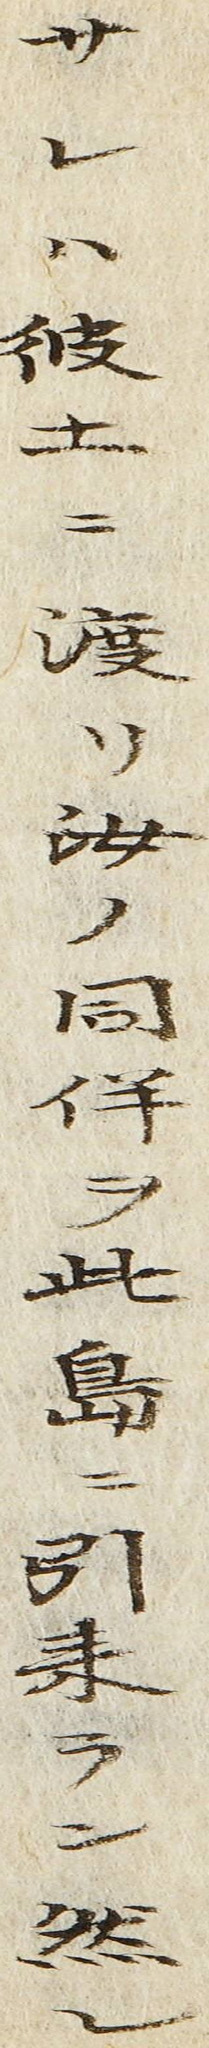サレハ彼土ニ渡リ汝ノ同伴ヲ此島ニ引来ラン然レ
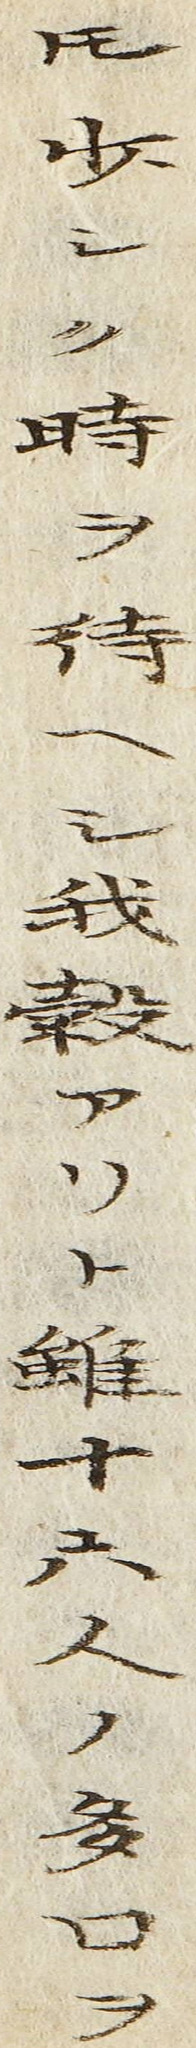トモ少シク時ヲ待ヘシ我穀アリト雖十六人ノ多口ヲ
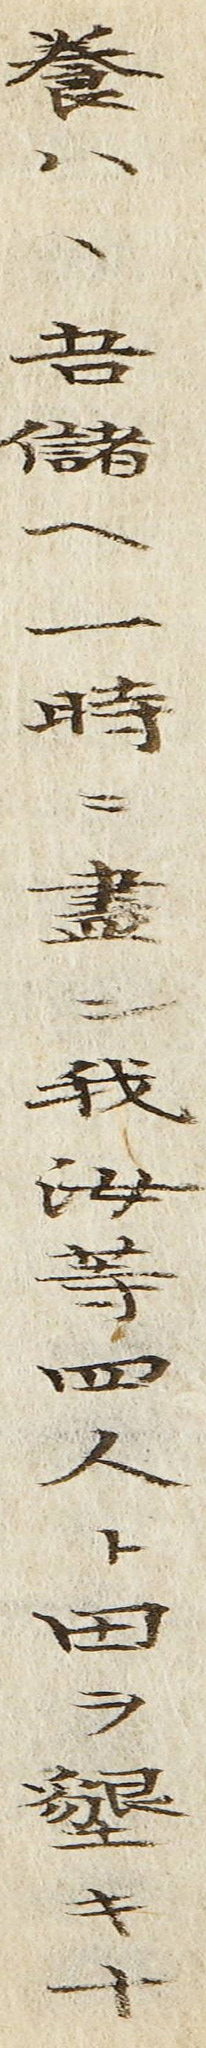養ハヽ吾儲ヘ一時ニ尽ン我汝等四人ト田ヲ墾キ十
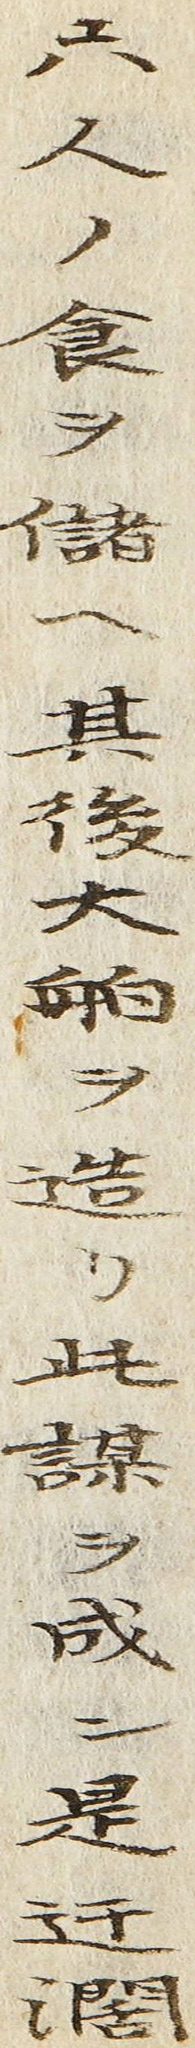六人ノ食ヲ儲ヘ其後大舶ヲ造リ此謀ヲ成ン是迂闊
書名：漂流紀事
